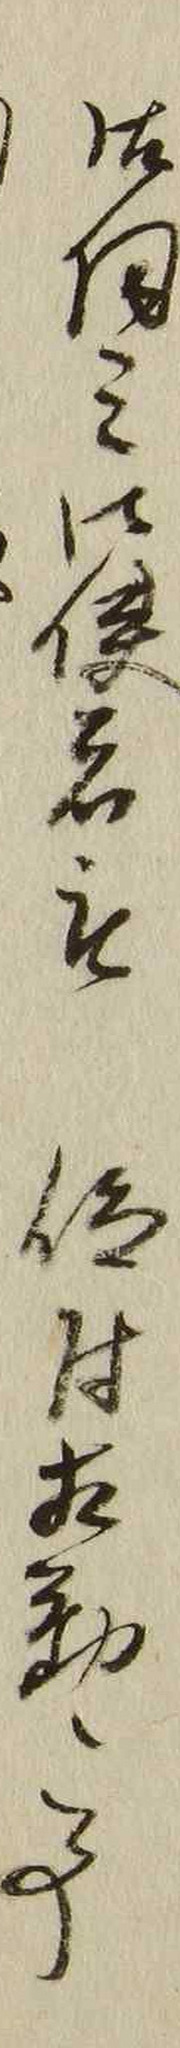御伺之御使者被仰付相勤候事
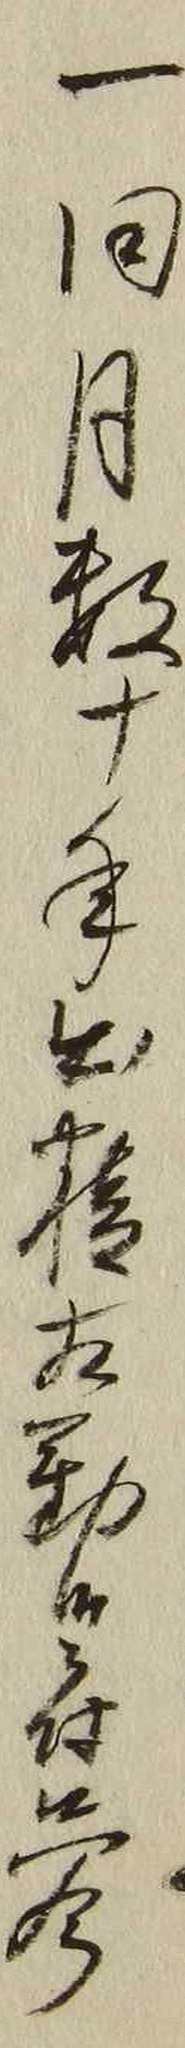一同月数十年出精相勤候ニ付只今
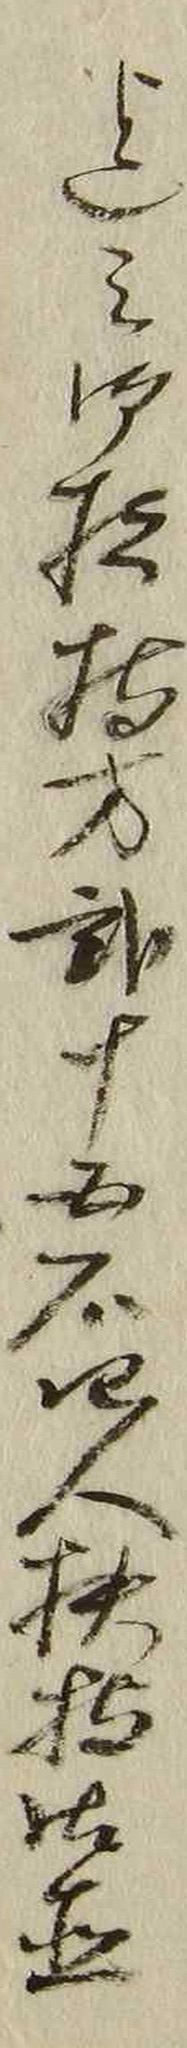迄之御扶持方弐十五石四人扶持御直
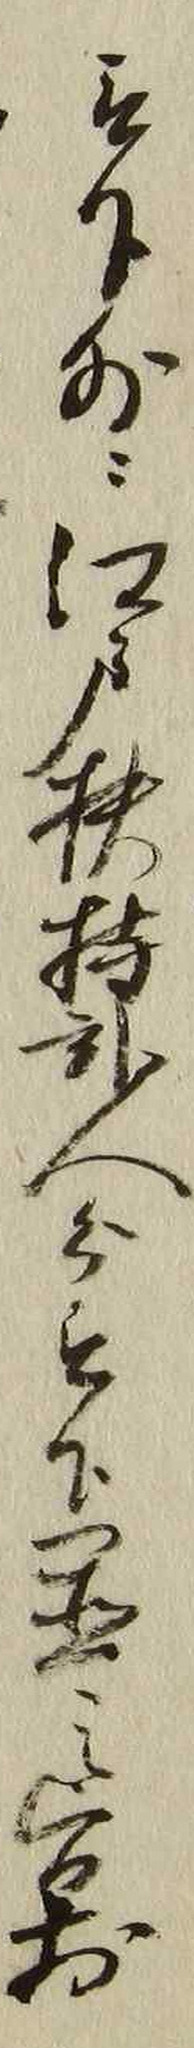被下外ニ江戸扶持弐人分被下置之旨於
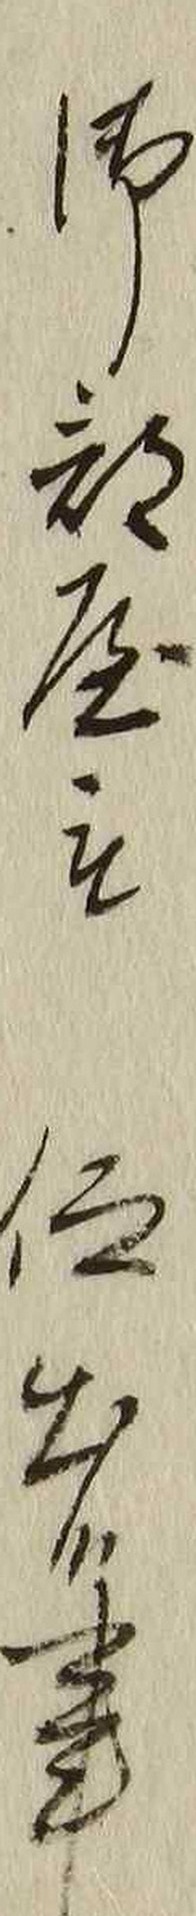御部屋被仰出候事
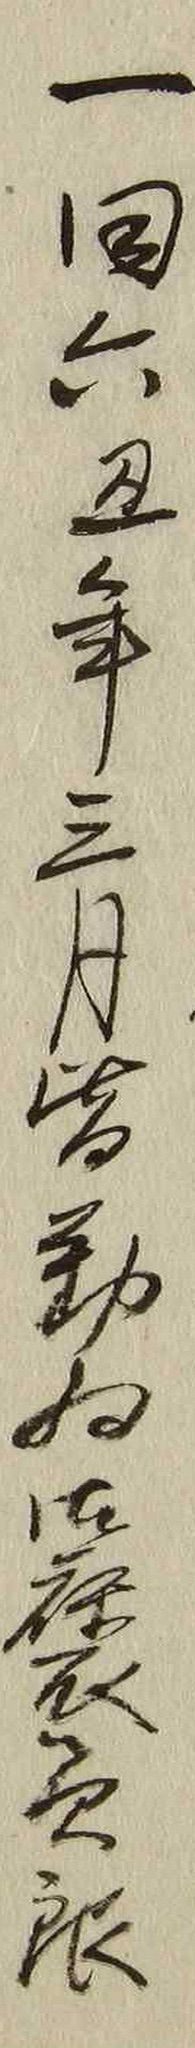一同六丑年三月皆勤為御褒美銀
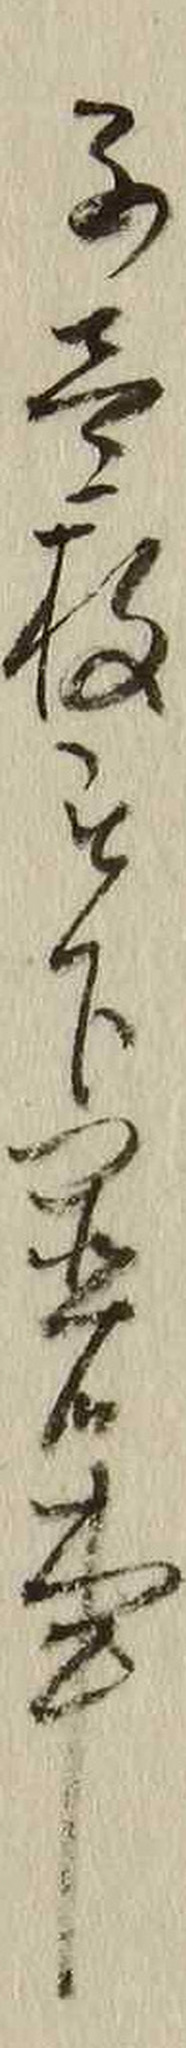子壱存被下置候事
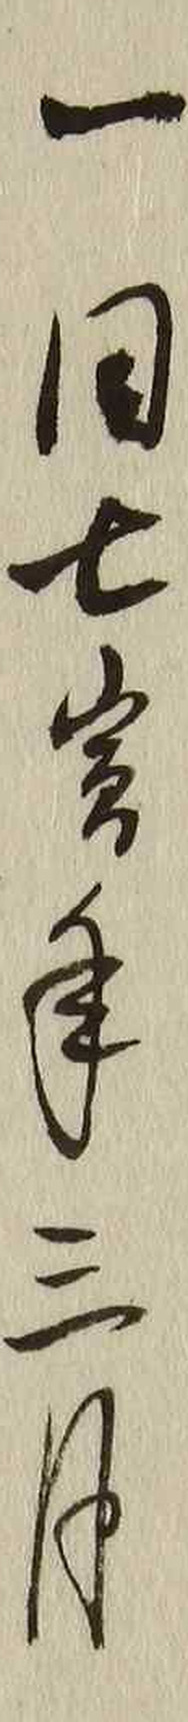一同七寅年三月
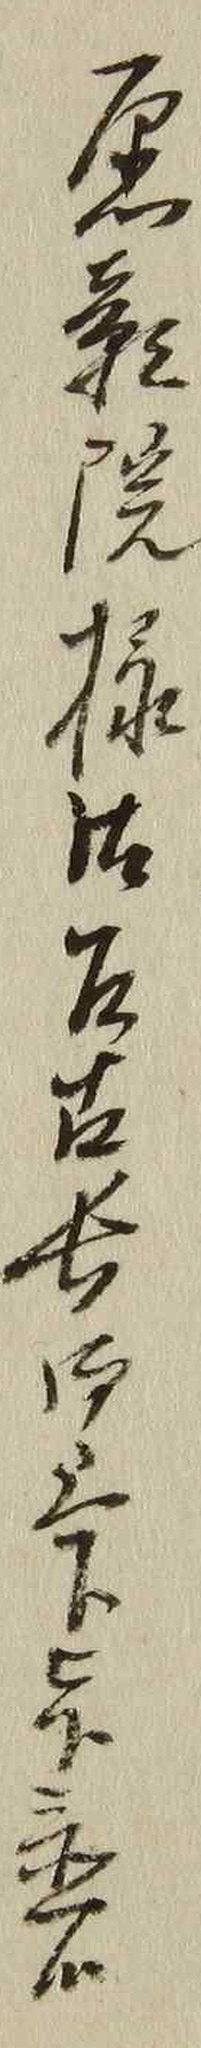愿彰院様御召古長御上下被下置候
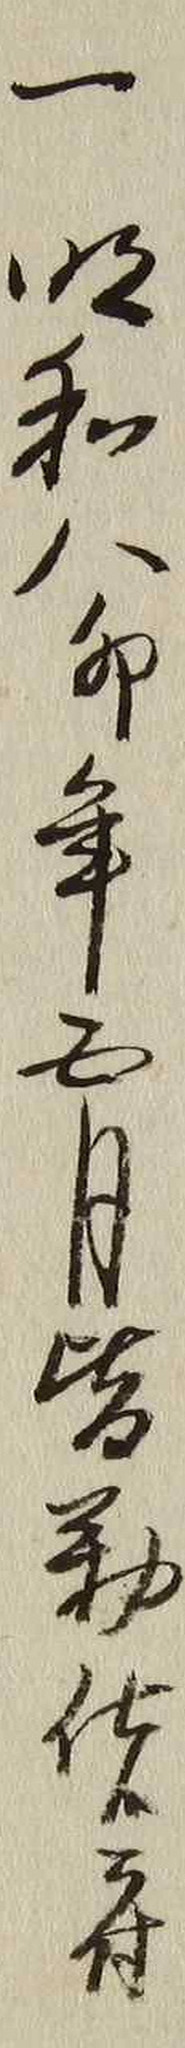一明和八卯年五月皆勤仕候ニ付
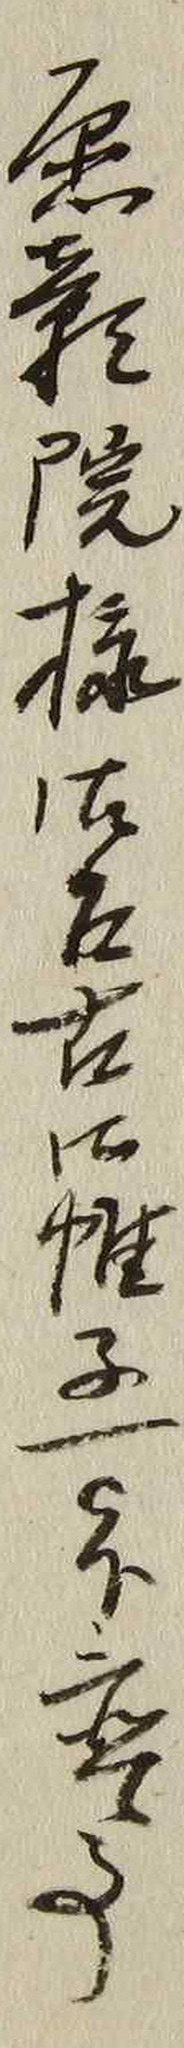愿彰院様御召古御帷子一被下置候事
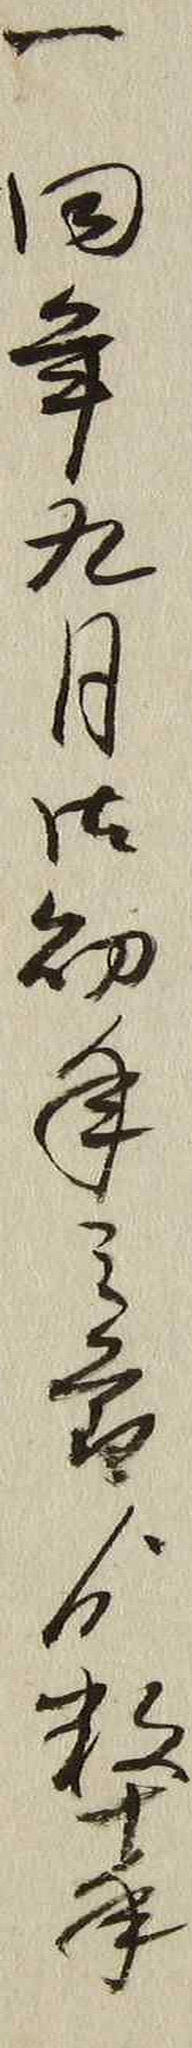一同年九月御幼年之節ゟ数十年
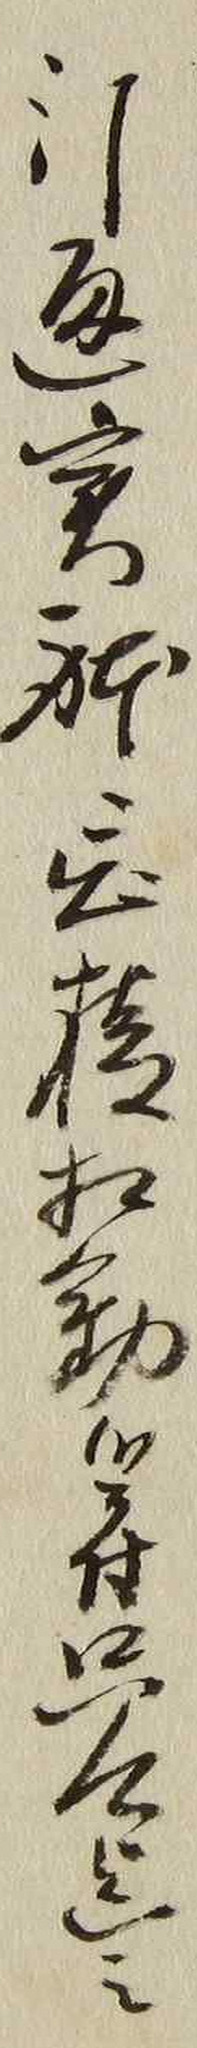引通実体ニ出精相勤候ニ付只今迄之
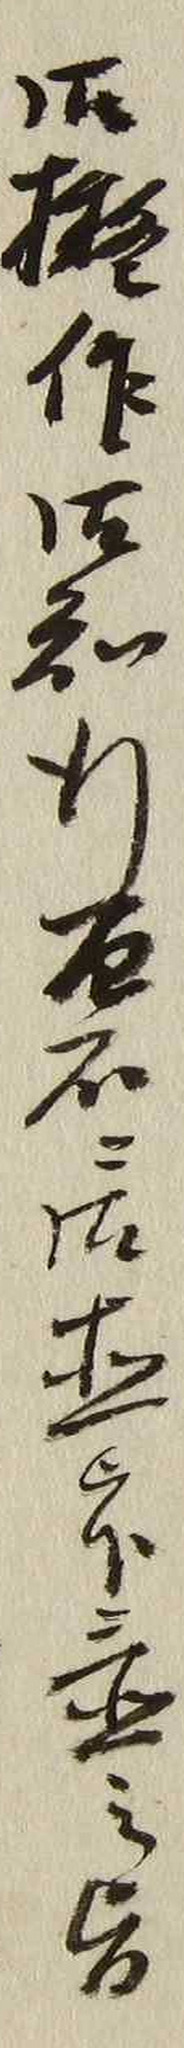御擬作御知行百石ニ御直被下置之旨
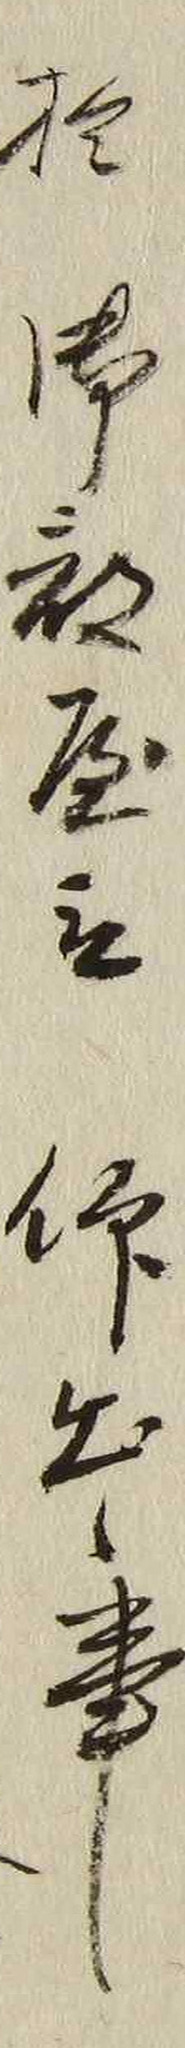於御部屋被仰出候事
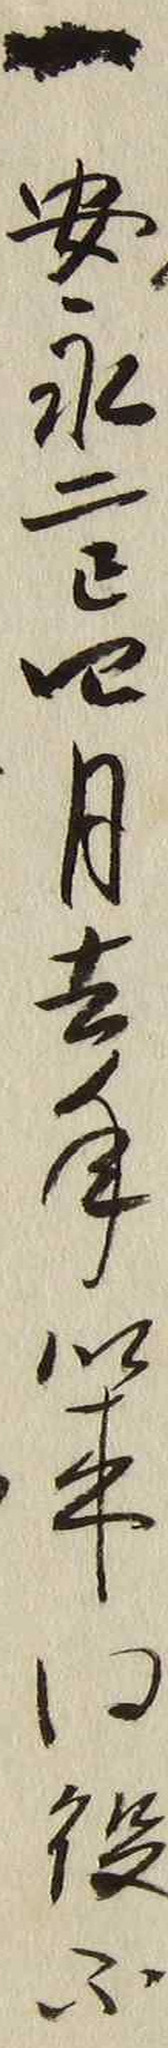一安永二巳四月去年以来同役不
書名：諸士系譜　巻之349　も之部5
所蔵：会津若松市立会津図書館
